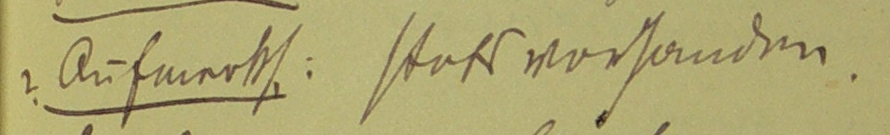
2. Aufmerks. : stets vorhanden
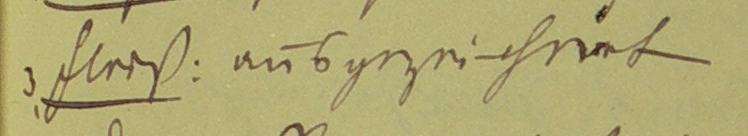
3. Fleiß: ausgezeichnet
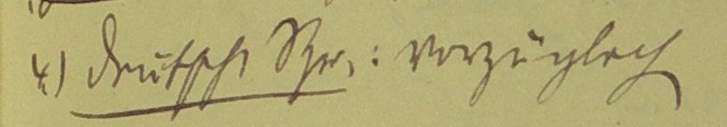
4. Deutsche Spr. vorzüglich
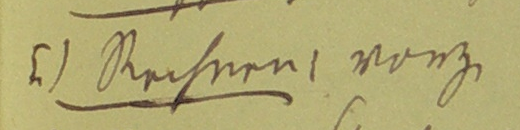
5. Rechnen.: vorzüglich
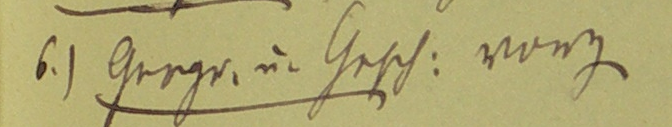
6.: Geogr. und Geschichte. vorzüglich
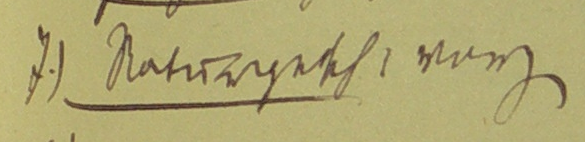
7. Naturgech.: vorzüglich
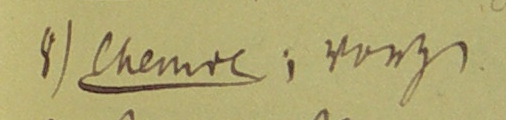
8. Chemie: vorzüglich
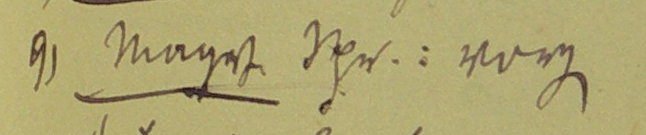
9.: Magyar. Spr. vorzüglich
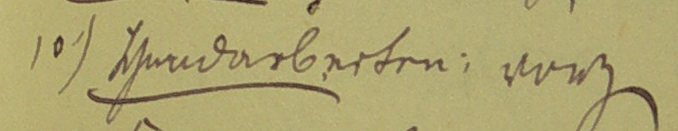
10. Handarbeiten: vorzüglich
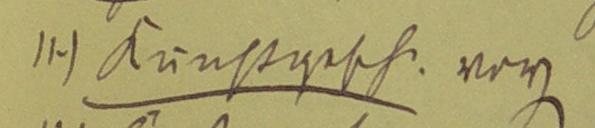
11. Kunstgesch.: vorzüglich
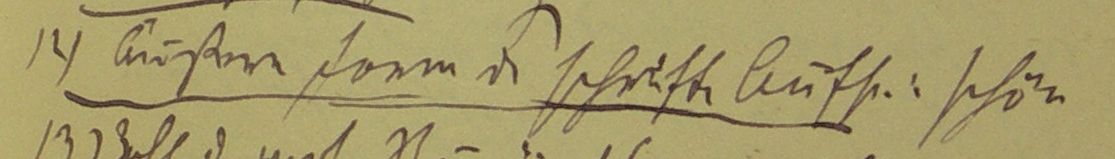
12. Äußere Form der schriftl. Aufs.: schön
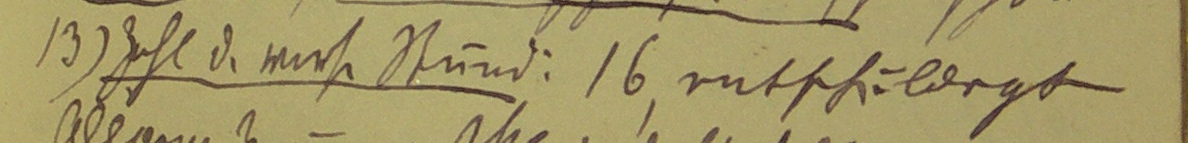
13. Zahl der vers.: Stunden: 16, entschuldigt
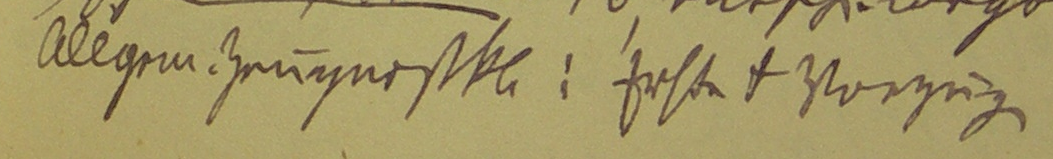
Allgemeine Zeugniskl.... : Erste mit Vorzüglich
